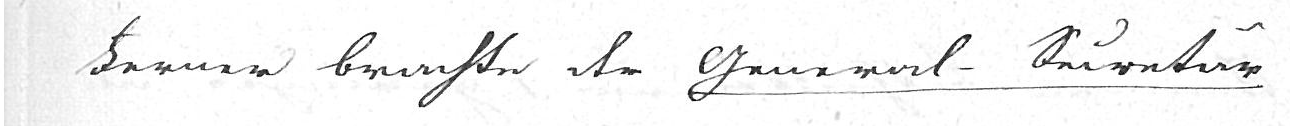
Ferner brachte der General-Secretär
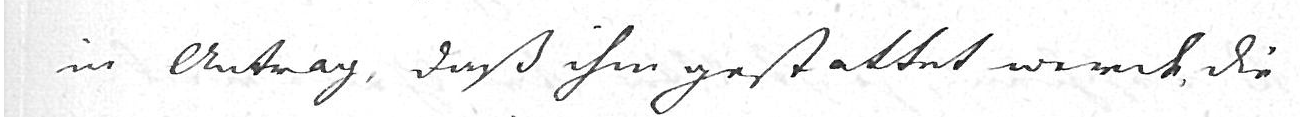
in Antrag, daß ihm gestattet werden, die
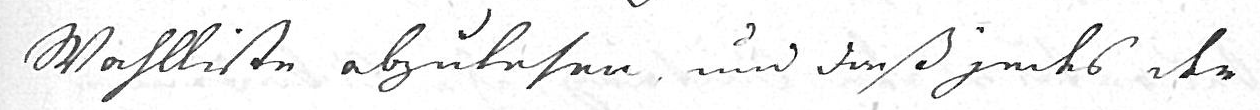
Wahllisten abzulesen und daß jedes der
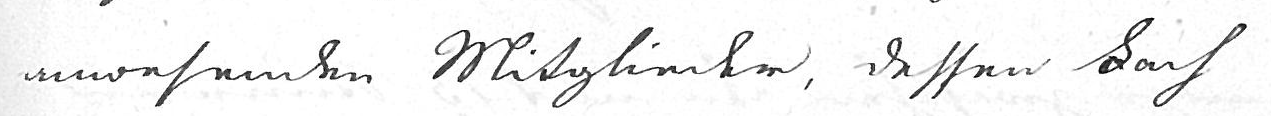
anwesenden Mitglieder, dessen Fach
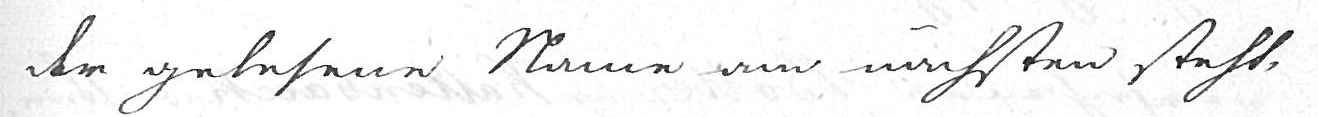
der gelesene Name am nächsten steht,
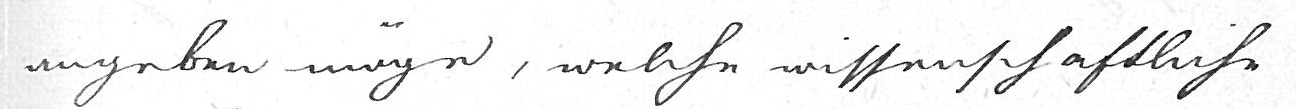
angeben möge, welche wissenschaftliche
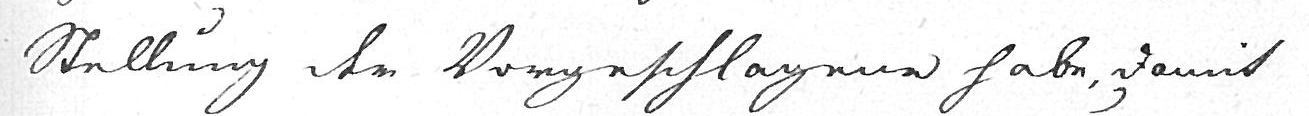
Stellung der Vorgeschlagene habe, damit
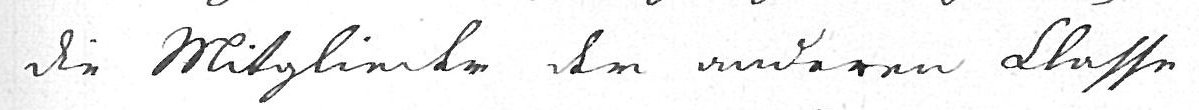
die Mitglieder der anderen Classe
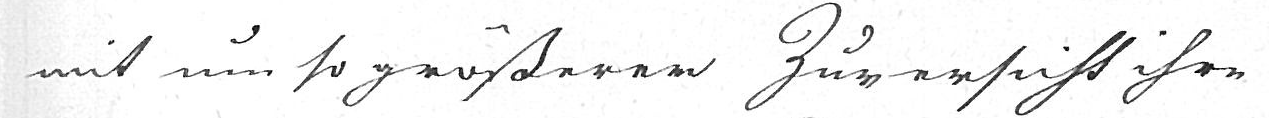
mit um so größerer Zuversicht ihre
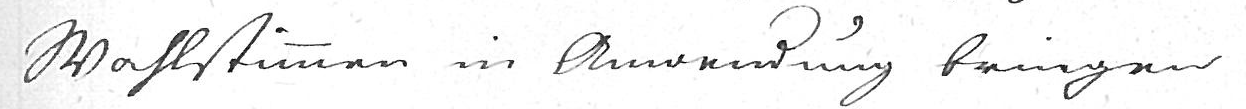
Wahlstimmen in Anwendnung bringen
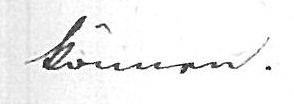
können.
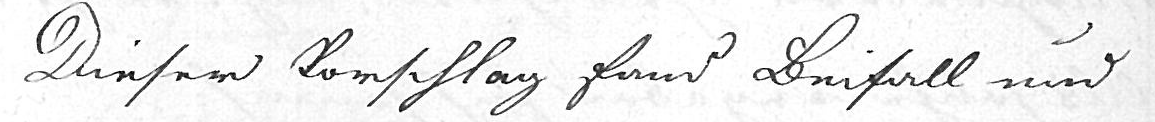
Dieser Vorschlag fand Beifall und
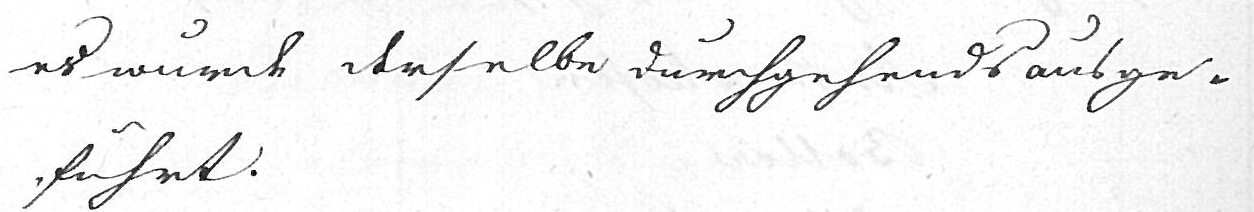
es wurde derselbe durchgehend ausge-
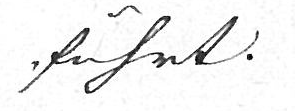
führt.
